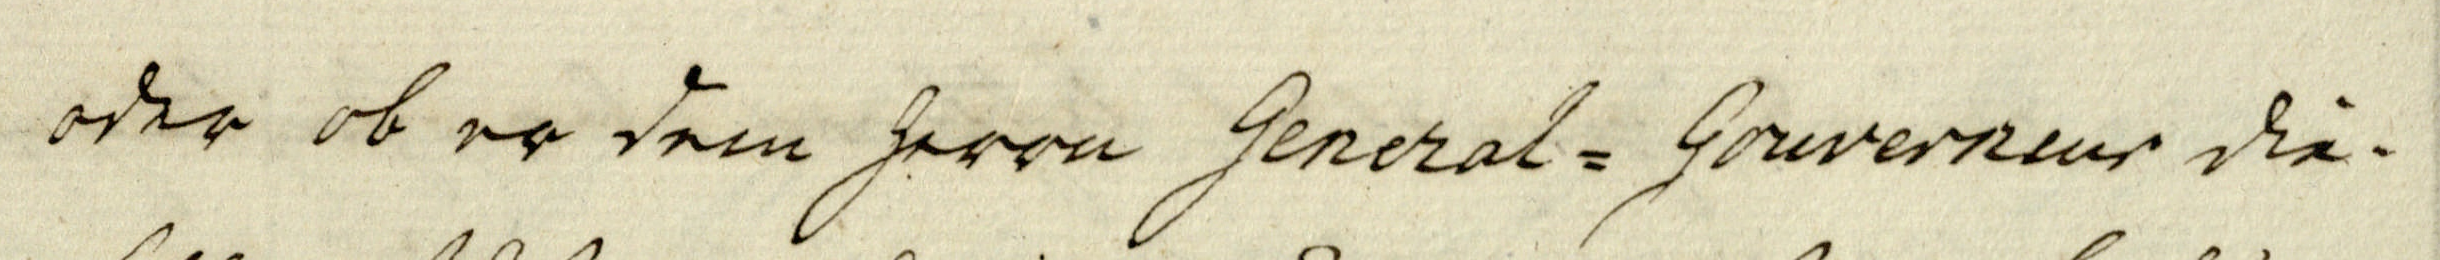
oder ob er dem Herrn General-Gouverneur die¬
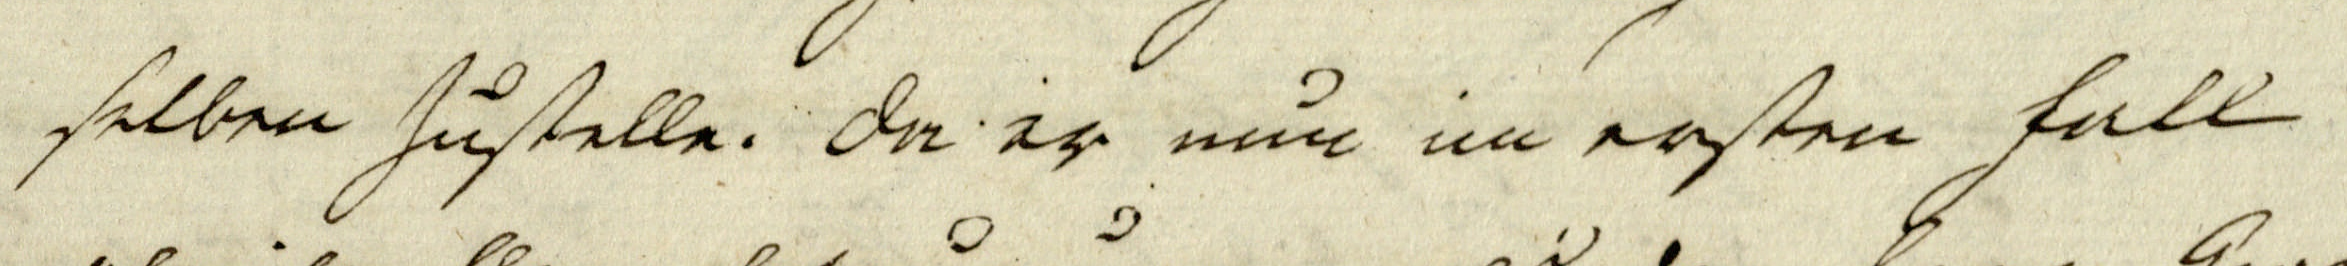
selben zustelle. Da er nun in ersten Fall
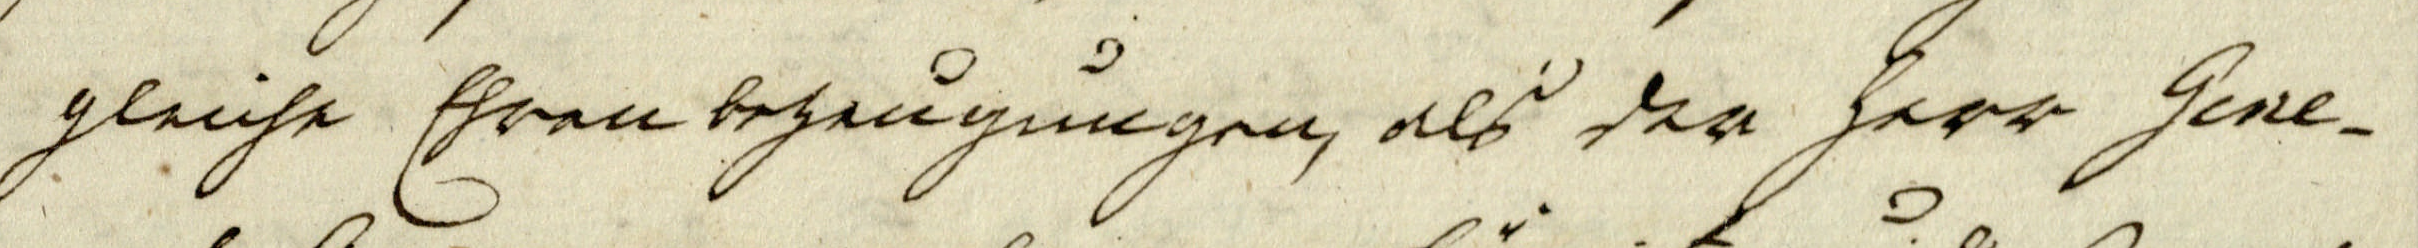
gleiche Ehren bezeugungen, als der Herr Gene¬
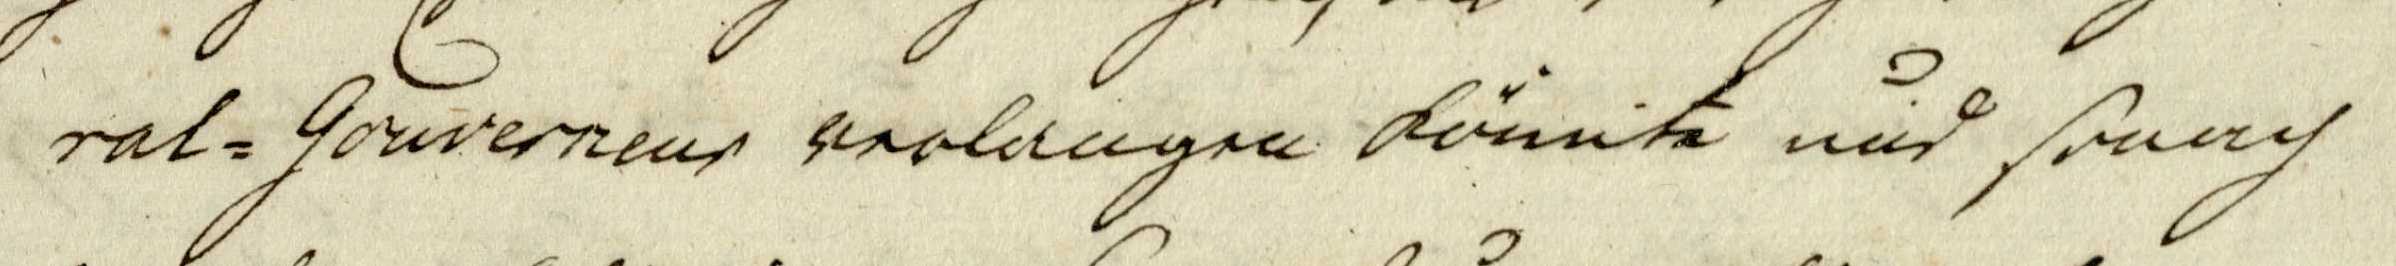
ral- Gouverneur verlangen könnte und sonach
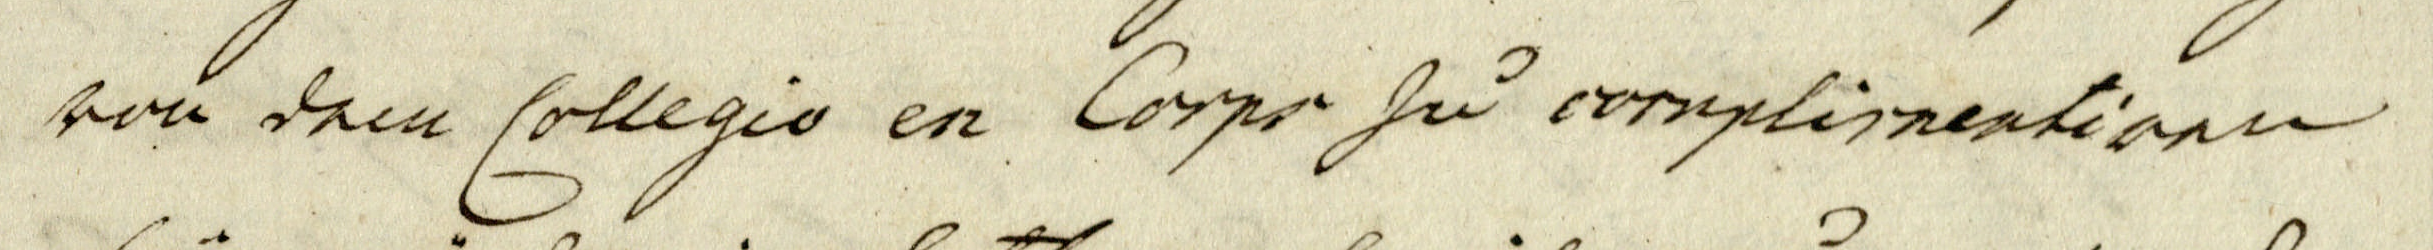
von dem Collegio en Corps zu complimentiren
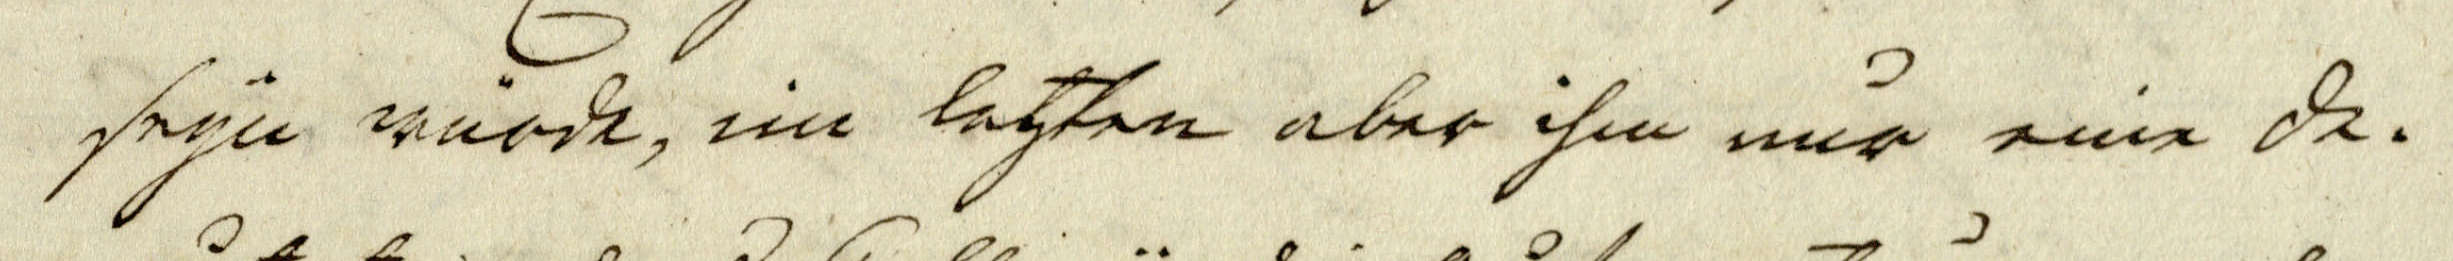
seÿn würde, im letzten aber ihm nur eine De¬
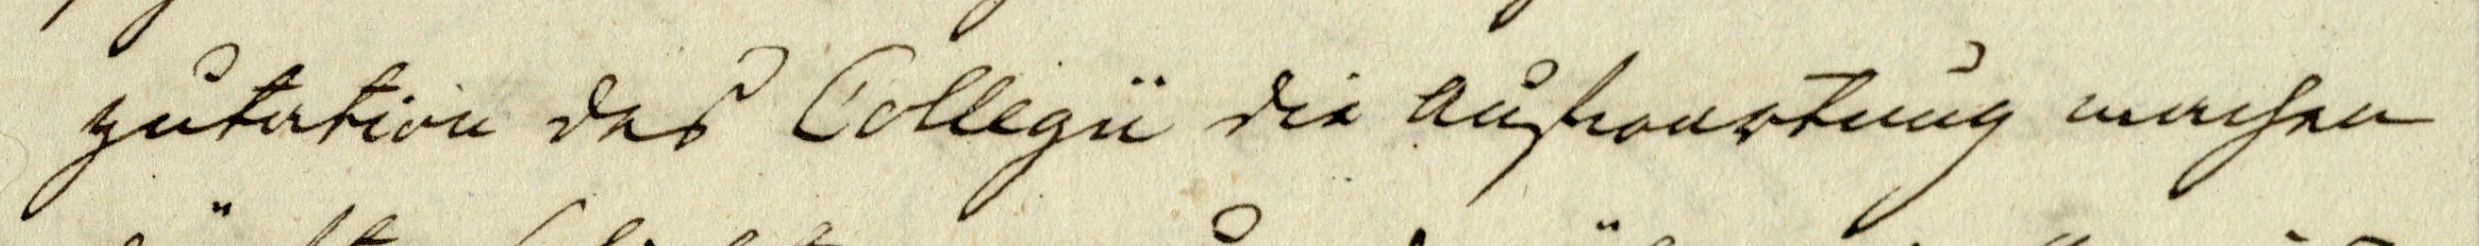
putation des Collegii die Aufwartung machen
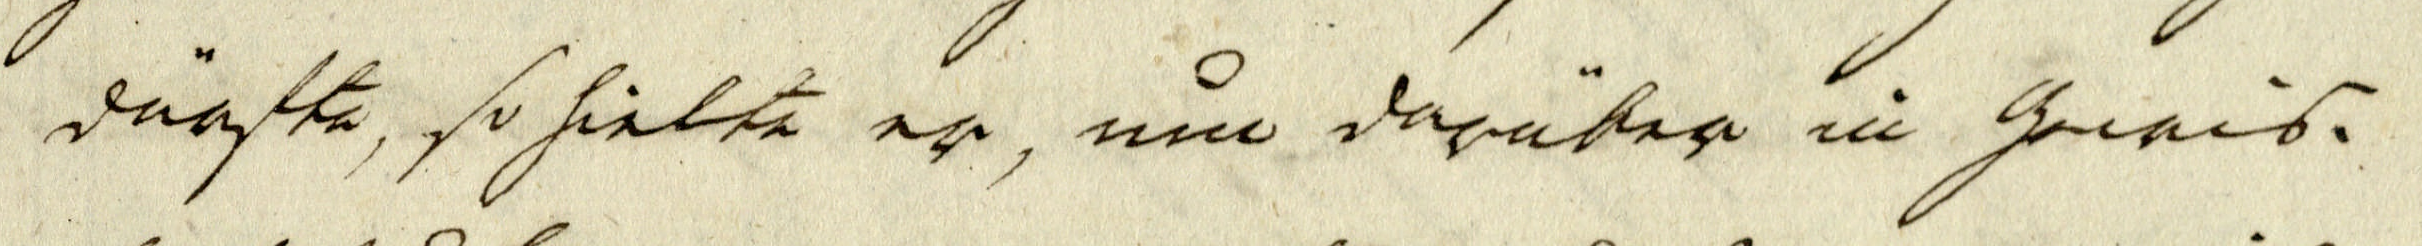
dürfte, so hielte er, um darüber in Gewis¬
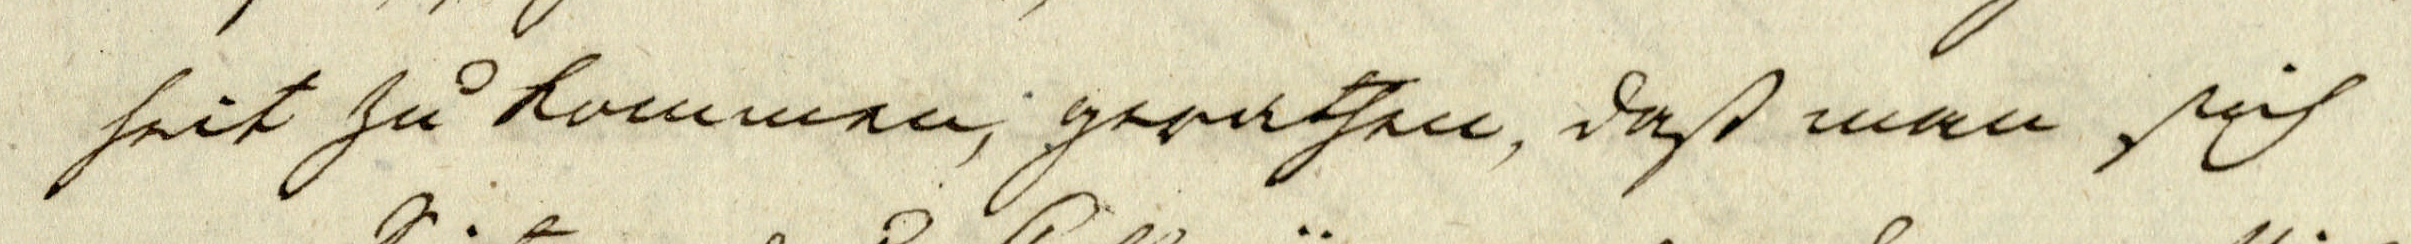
heit zu kommen; gerathen, daß man sich
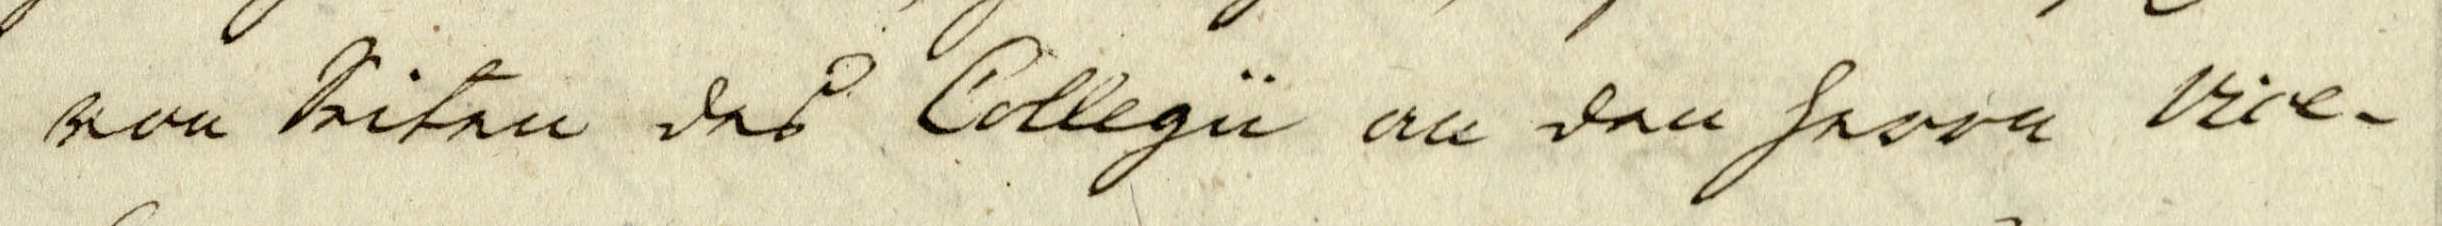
von Seiten des Collegii an den herrn Vice-
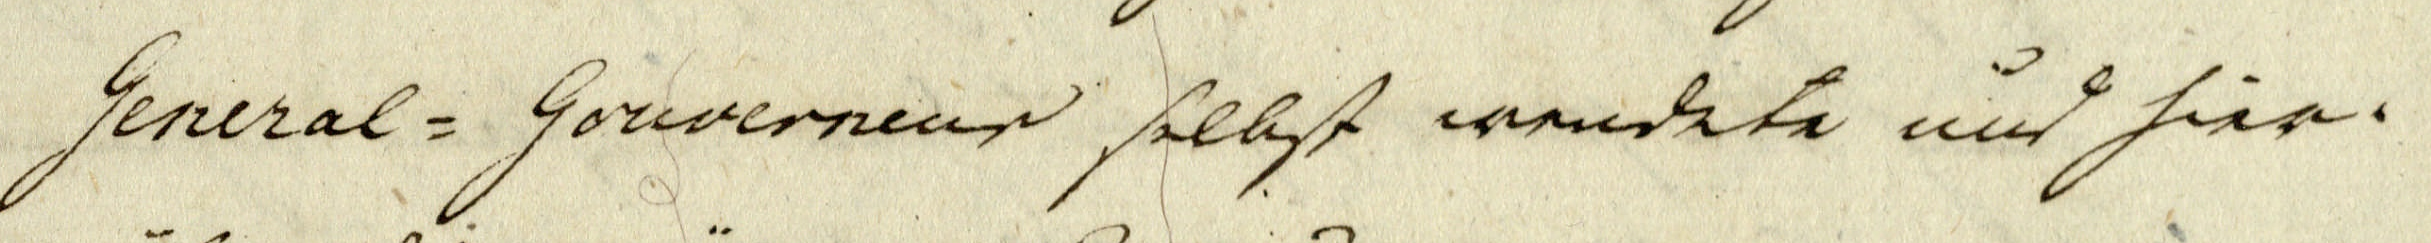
General- Gouverneur selbst wendete und hier¬
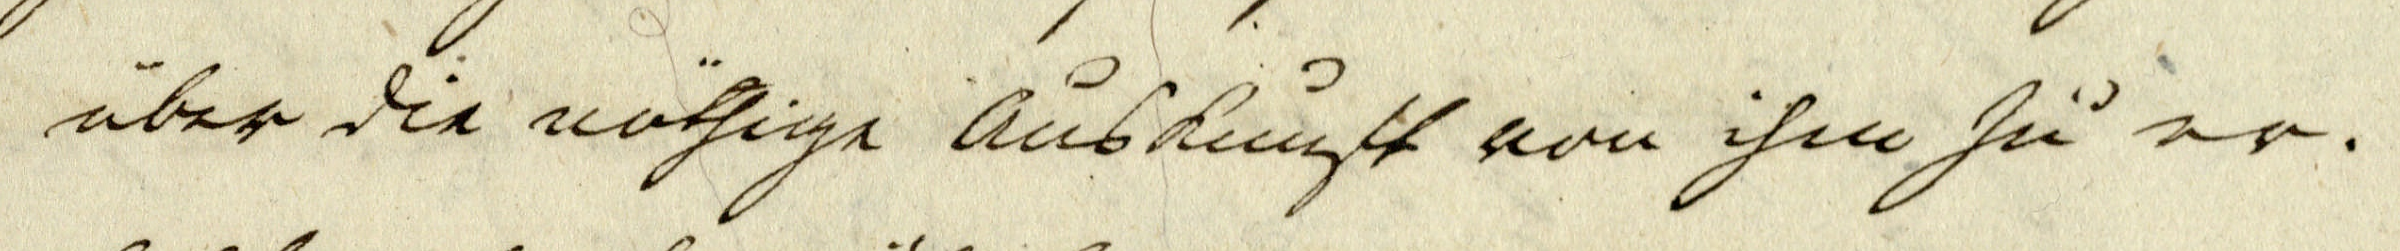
über die nöthige Auskunft von ihm zu er¬
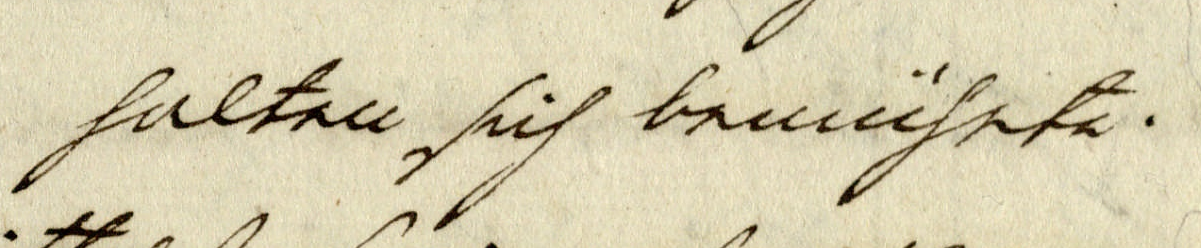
halten sich bemühete.
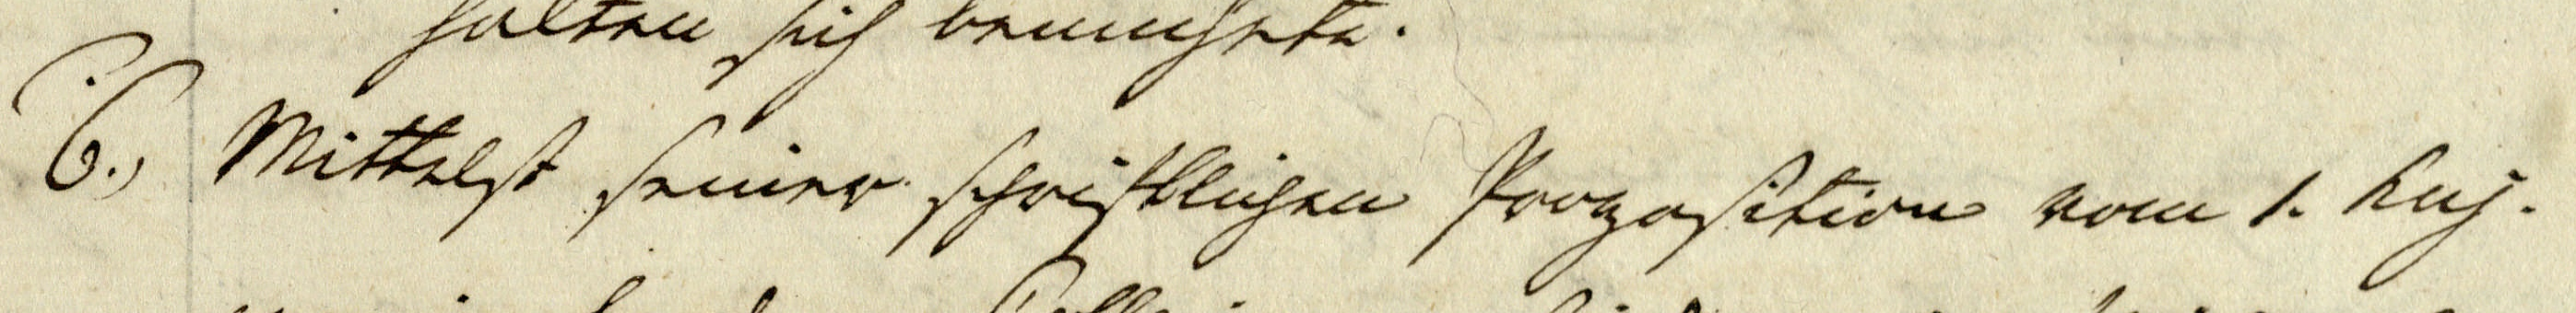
6., Mittelst seiner schriftlichen Proposition vom 1. huj.
